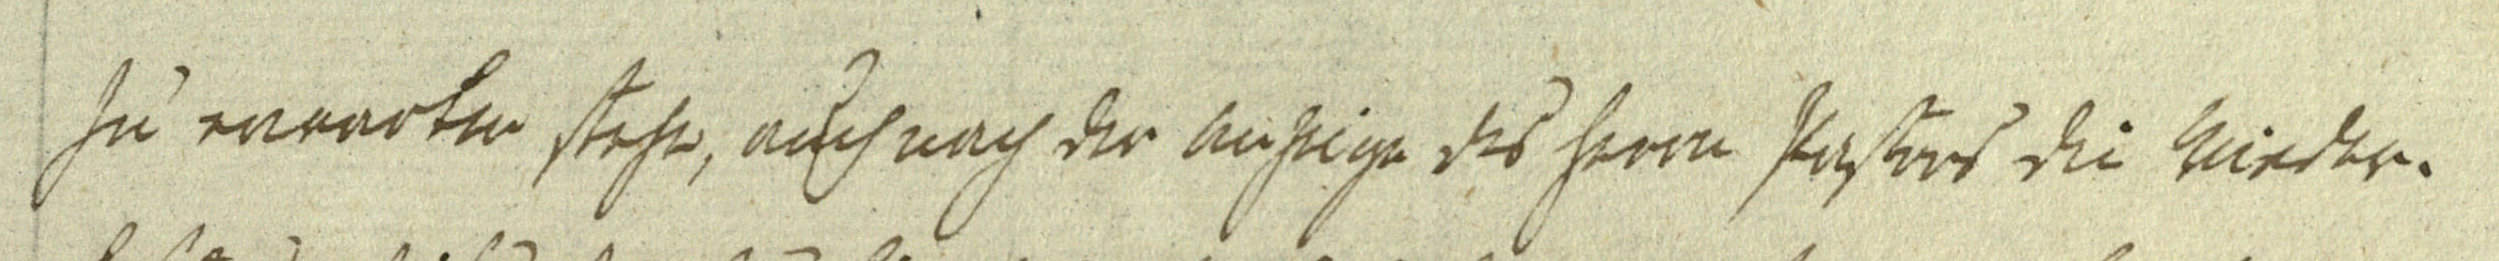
zu erwarten stehe, auch nach der Anzeige des Herrn Pastors die Wieder¬
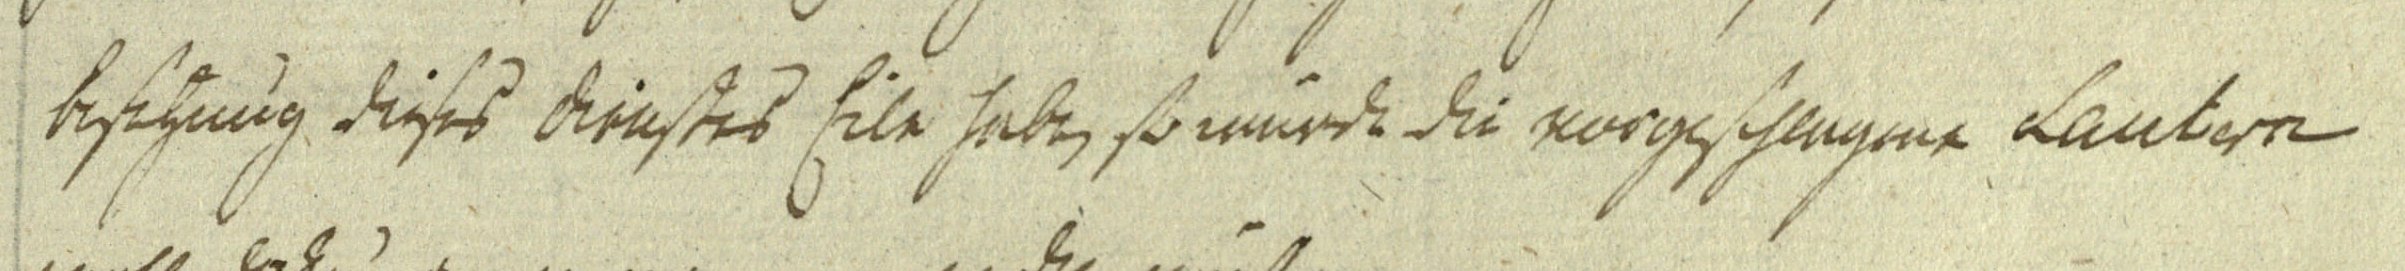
besetzung dieses Dienstes Eile habe, so würde die vorgeschlagene Lautern
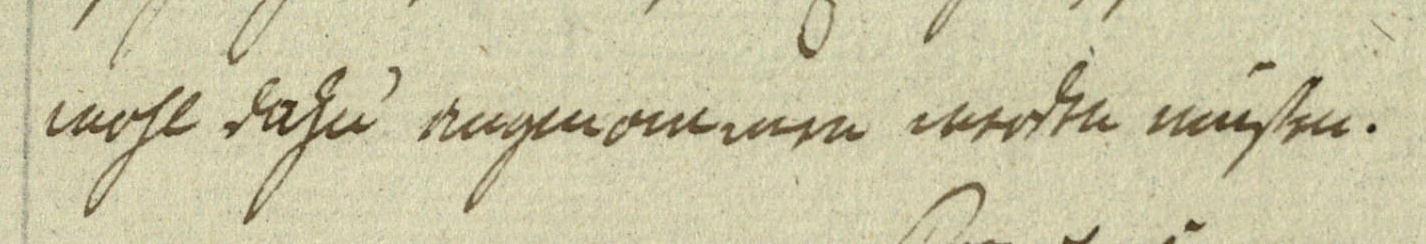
wohl dazu angenommen werden müssen.
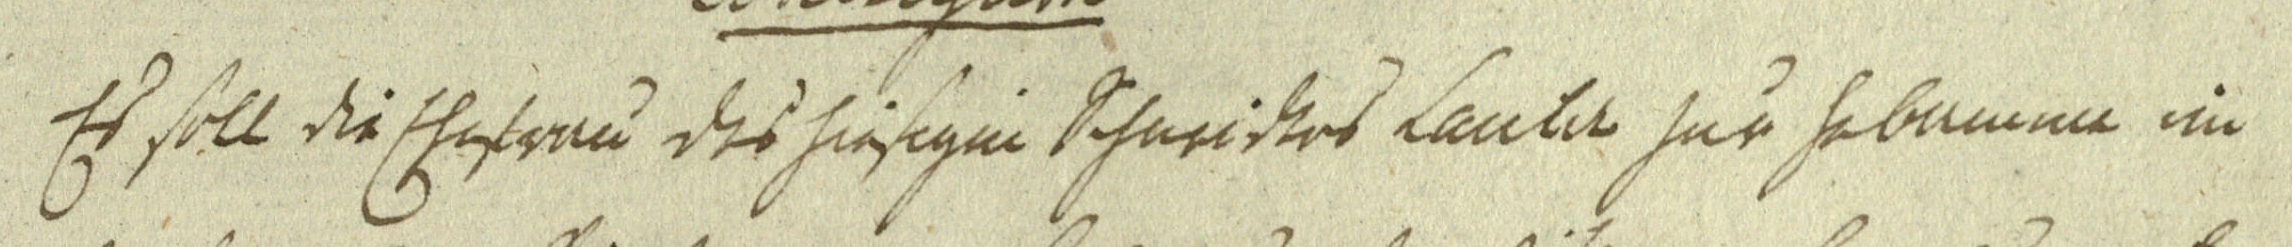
Es soll die Ehefrau des hiesigen Schneiders Lauter zur Hebamme im
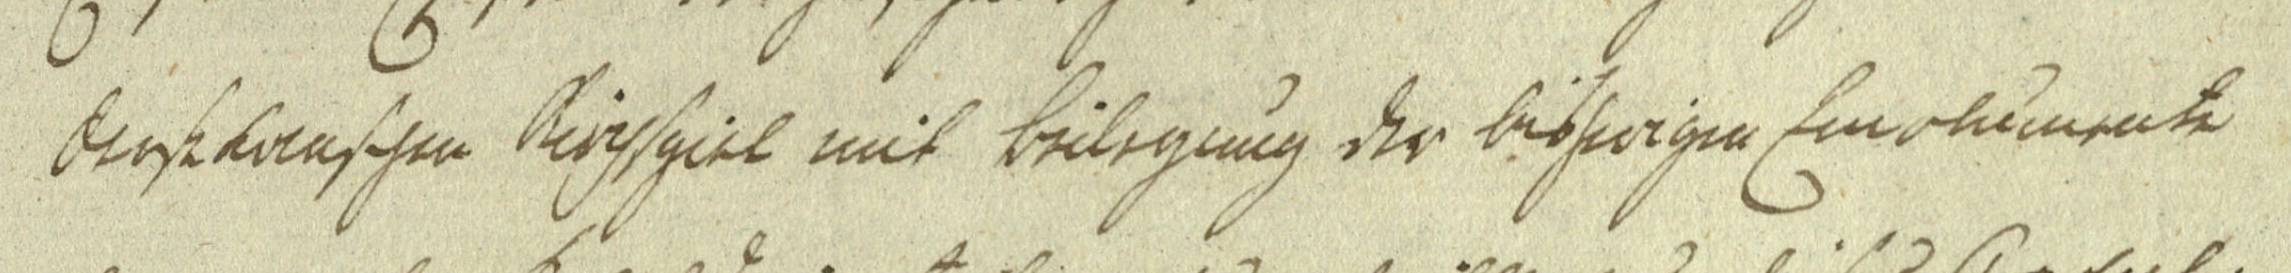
Dersekowschen Kirchspiel mit Beilegung der bisherigen Emolumente
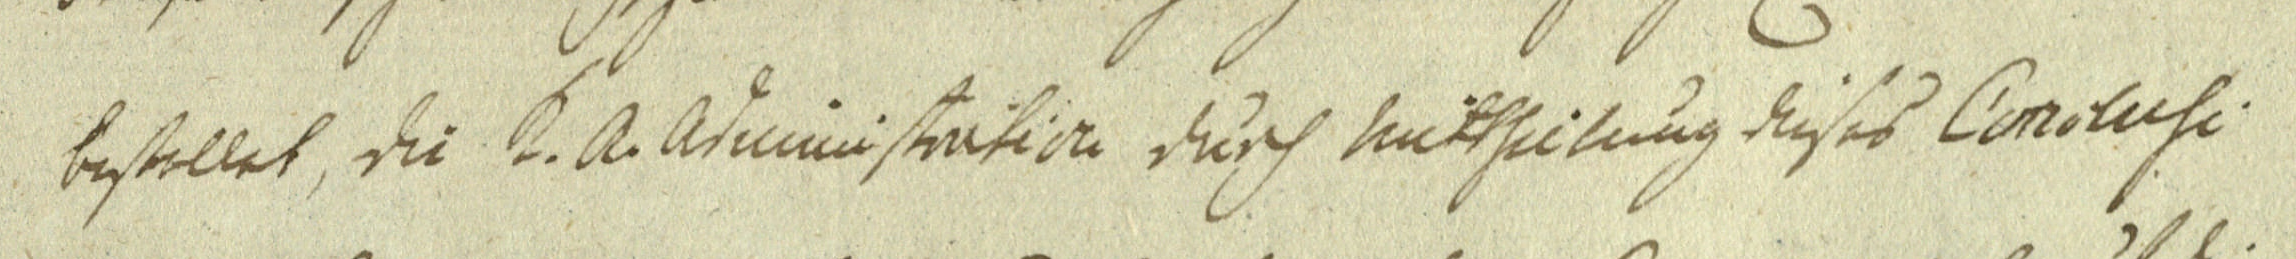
bestellet, die K. A. Administration durch Mittheilung dieses Conclusi
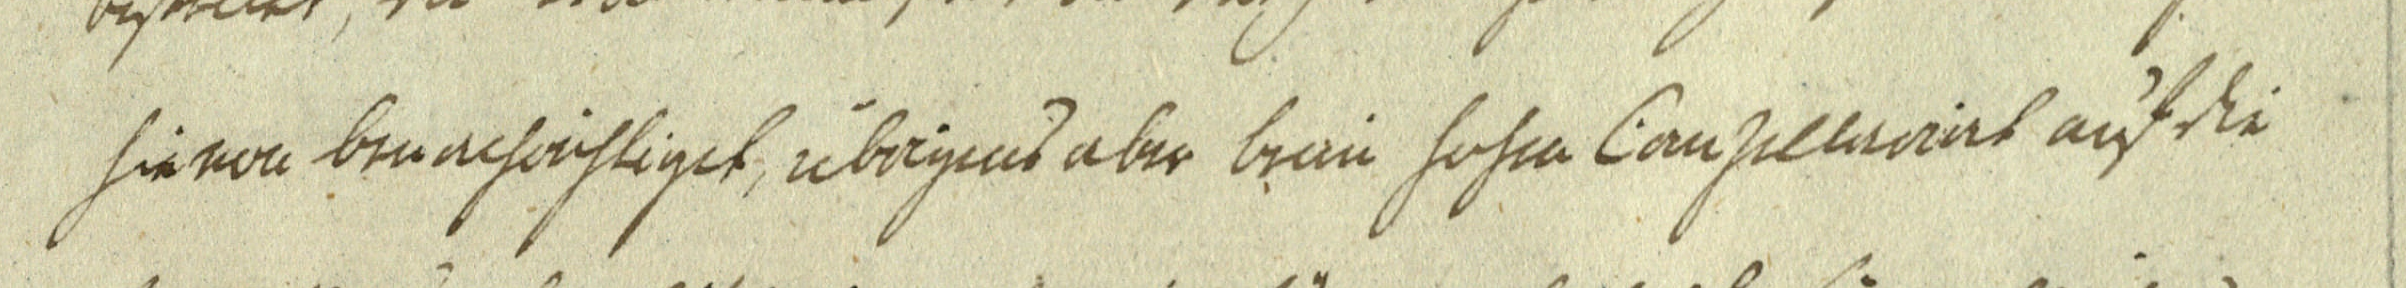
hievon benachrichtiget, übrigens aber beim hohen Canzellariat auf die
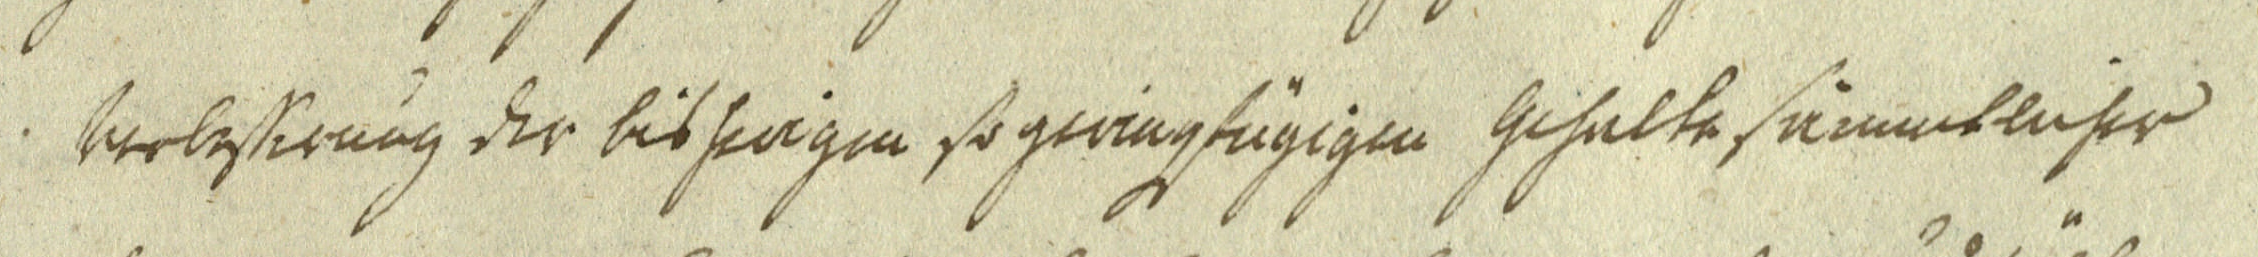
Verbesserung der bisherigen so geringfügigen Gehalte sämmtlicher
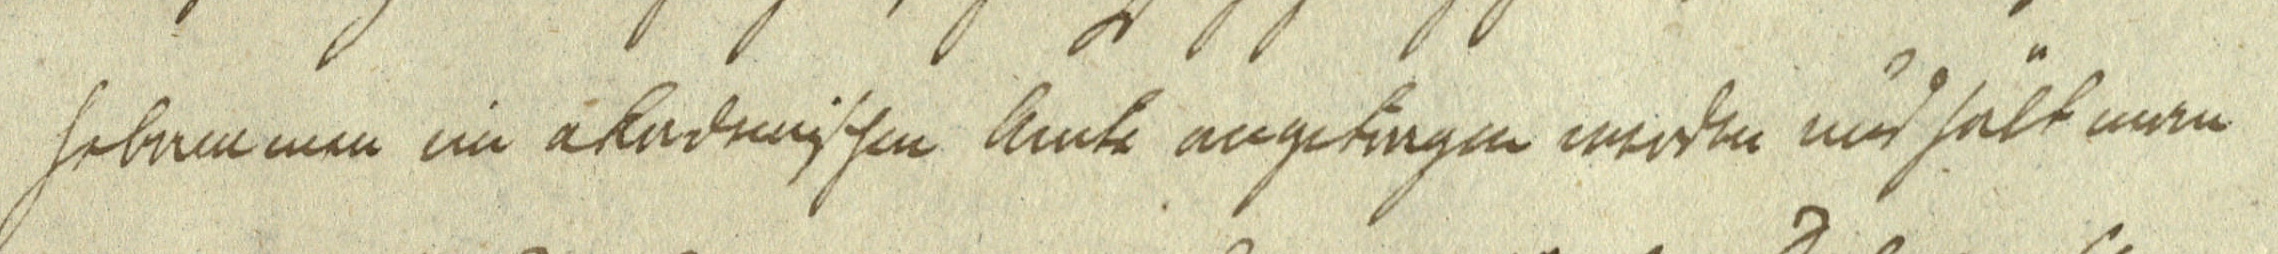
Hebammen im akademischen Amte angetragen werden und hält man
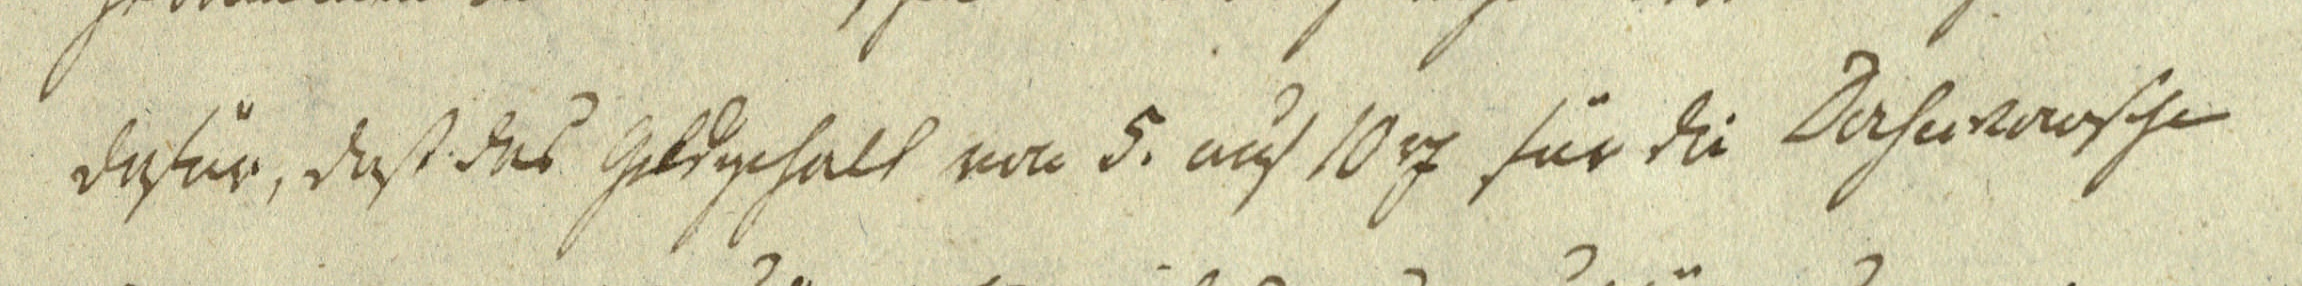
dafür, daß des Gedgehalt von 5. auf 10 rt für die Dersekowsche
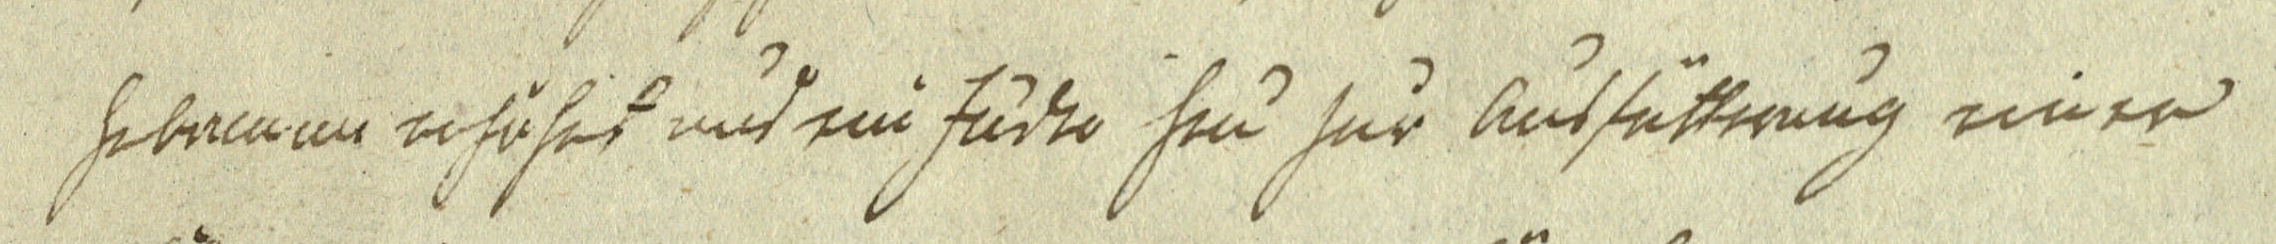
Hebamme erhöhet und ein Fuder Heu zur Ausfütterung einer
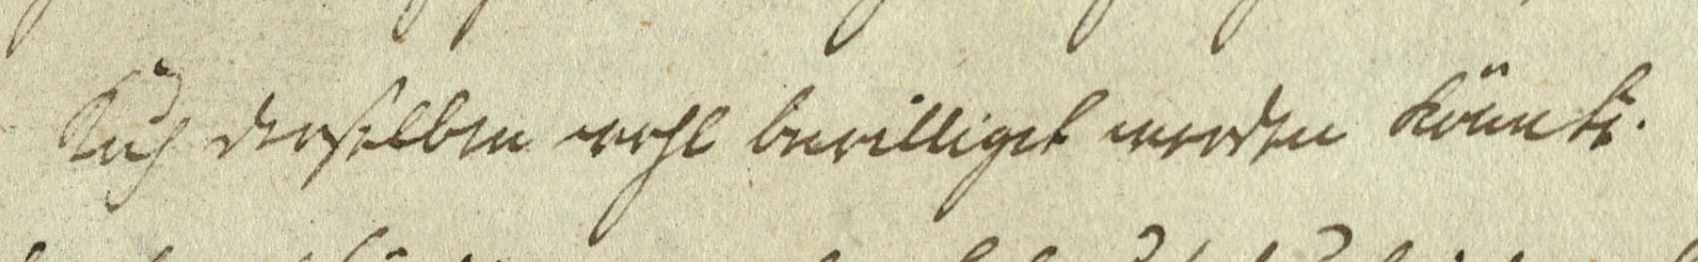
Kuh derselben wohl bewilliget werden könnte.
